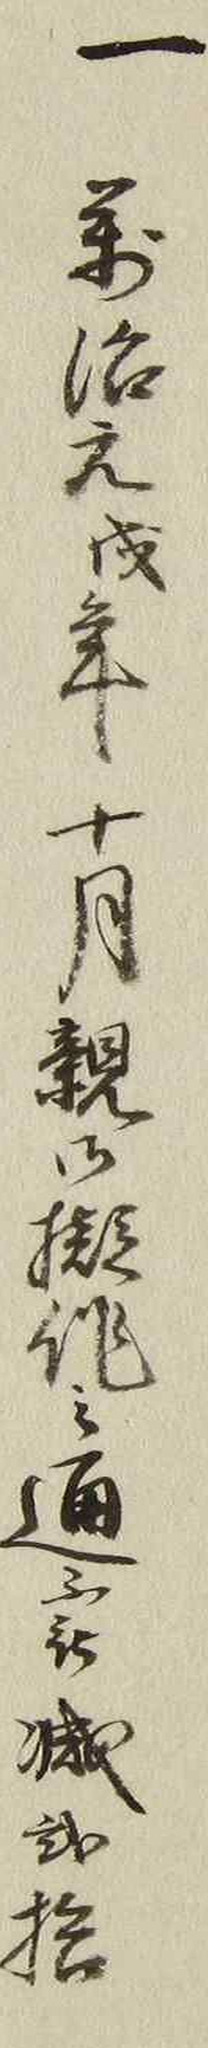一万治元戌年十月親御擬作之通不被減弐拾
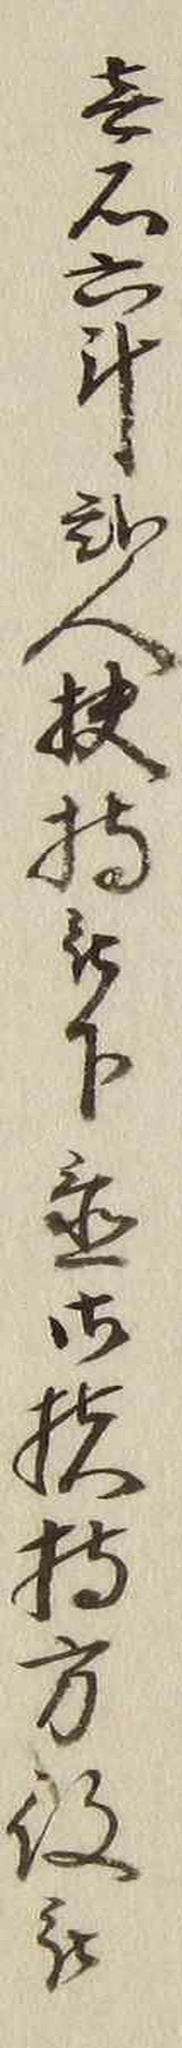壱石六斗弐人扶持被下置御扶持方役被
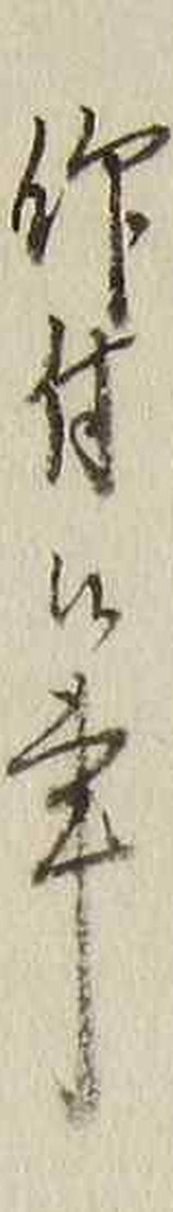仰付候事
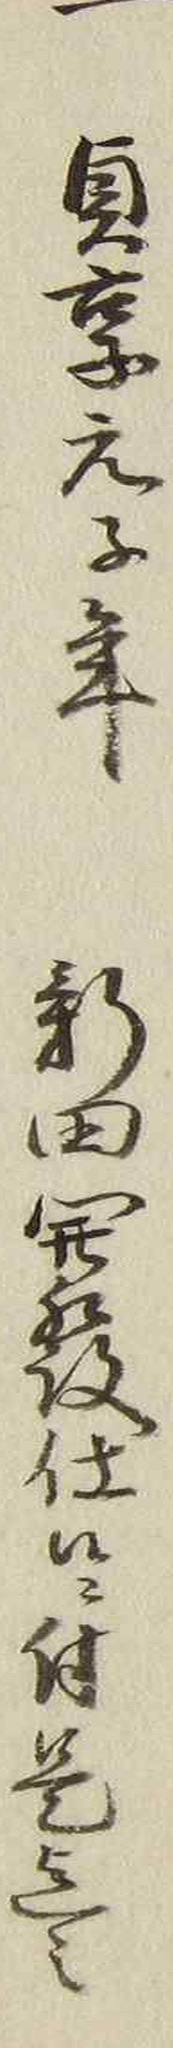一貞享元子年新田開発役仕候ニ付是迄之
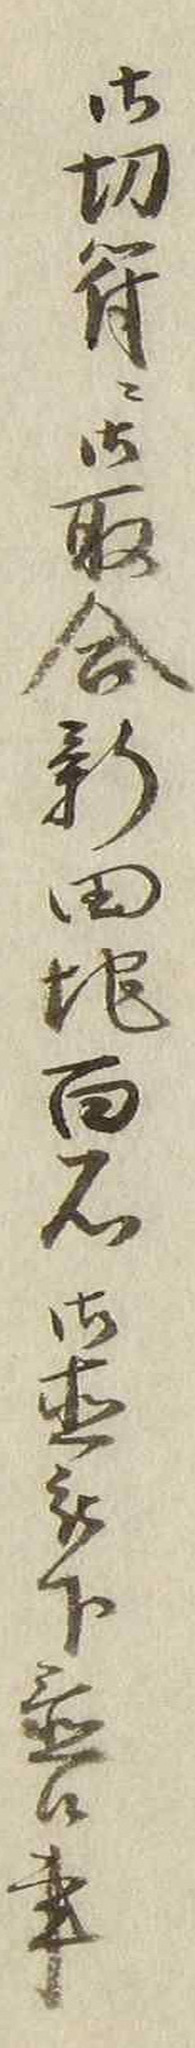御切符ニ御取合新田地百石御直被下置候事
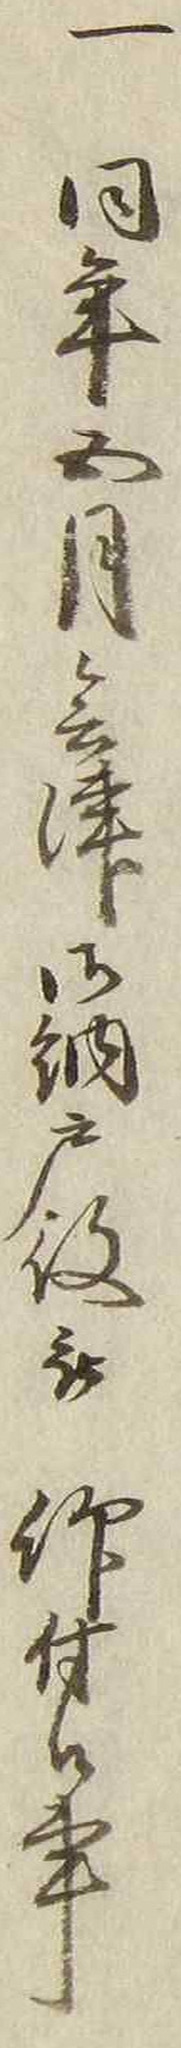一同年五月会津御納戸役被仰付候事

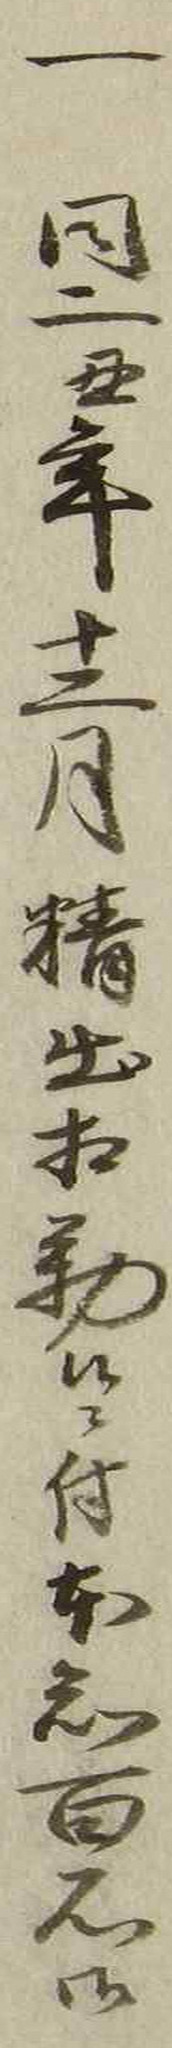一同二丑年十二月精出相勤候ニ付本知百石御
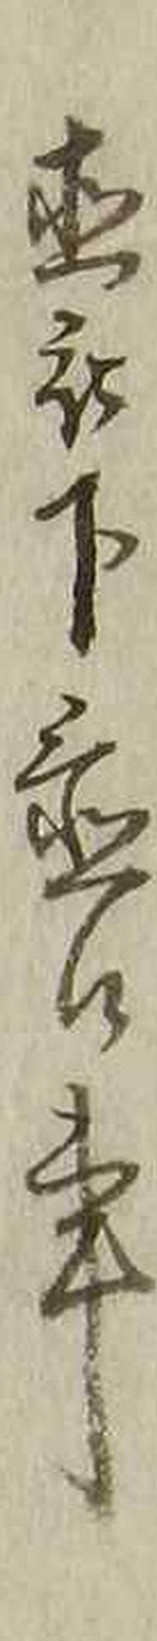直被下置候事
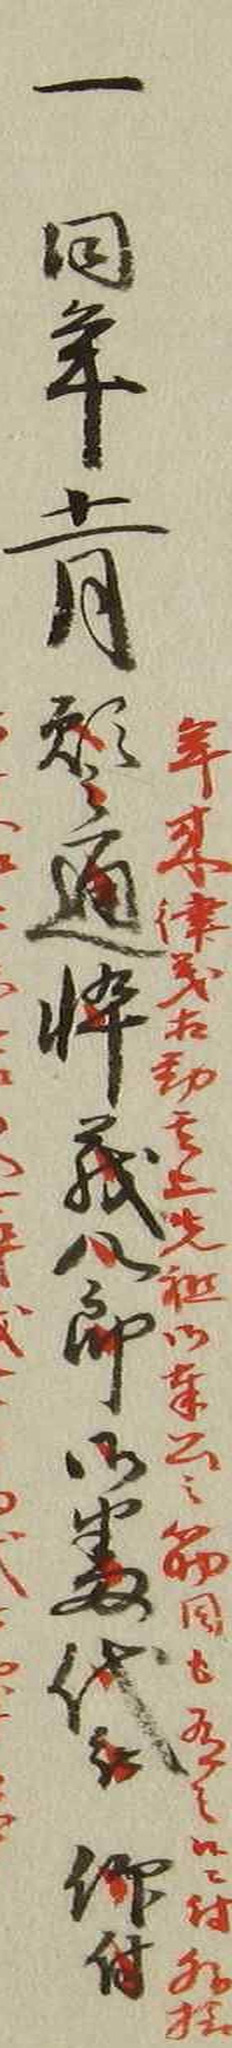一同年十一月願之通忰義八郎御番代被仰付
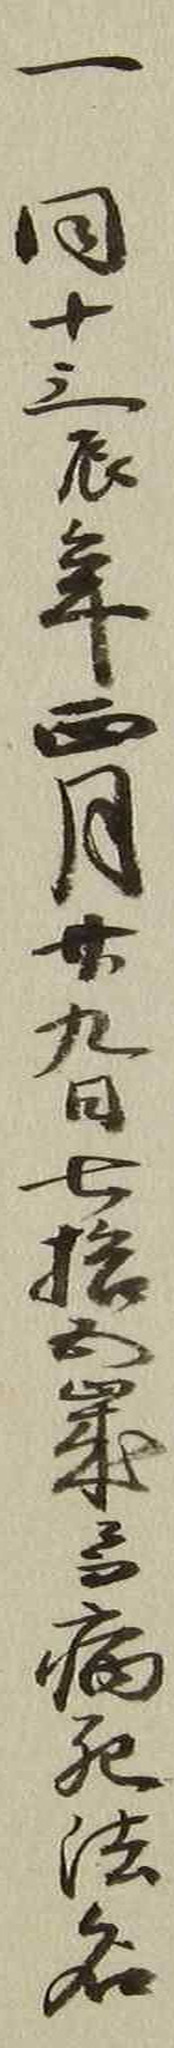一同十三辰年正月廿九日七拾五歳ニ而病死法名
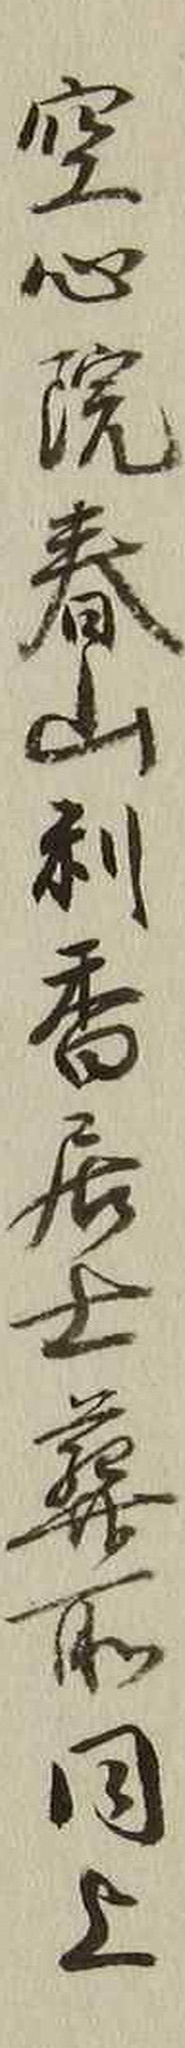空心院春山利香居士葬所同上
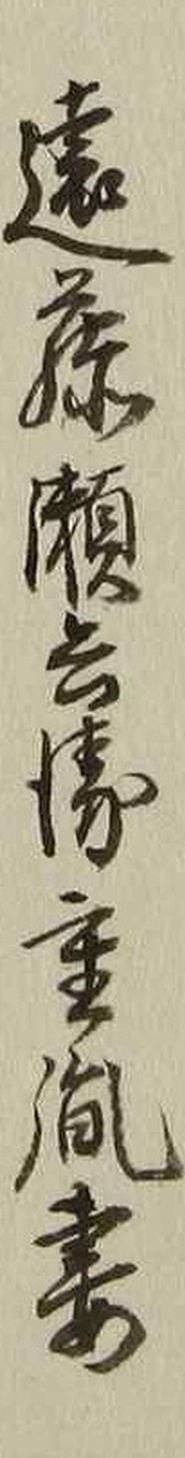女遠藤瀬兵衛重胤妻
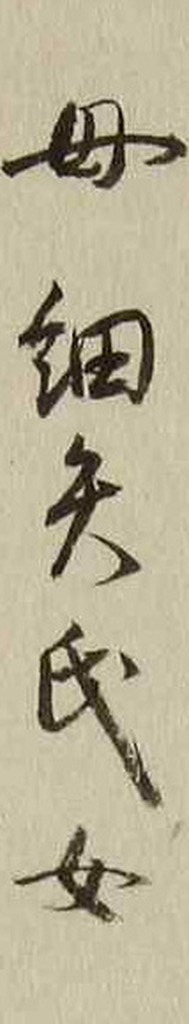母細矢氏女
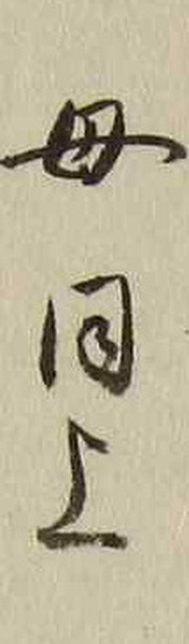母同上
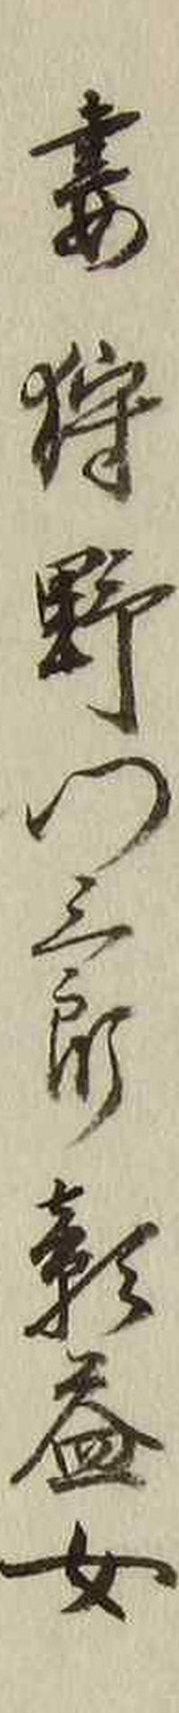妻狩野門三郎彰益女
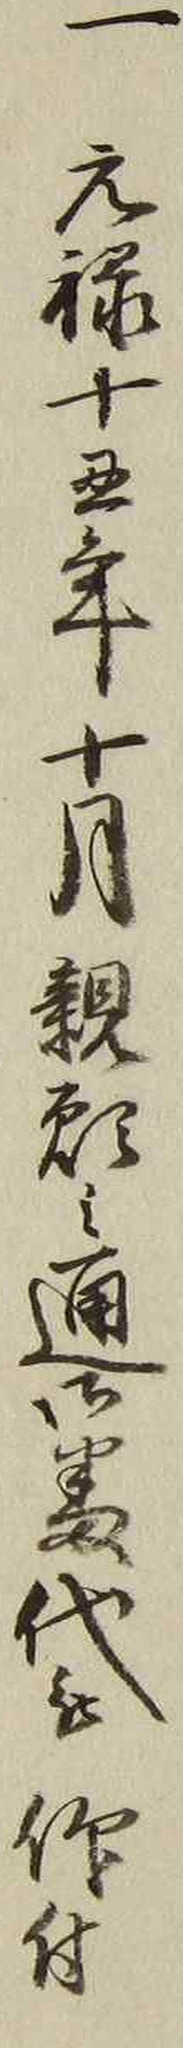一元禄十丑年十月親願之通御番代被仰付
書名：諸士系譜　巻之128　た之部4
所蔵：会津若松市立会津図書館
